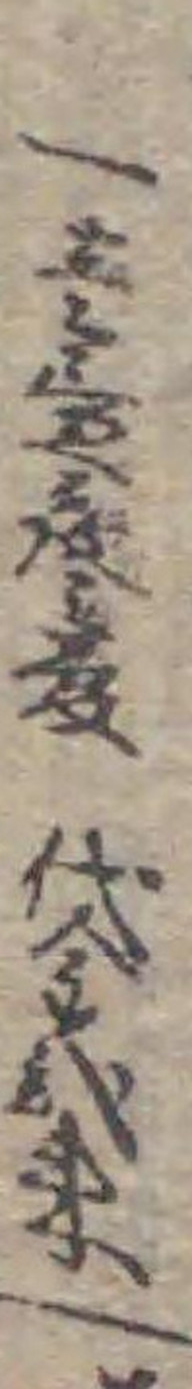一壱昼夜之夢代金弐朱
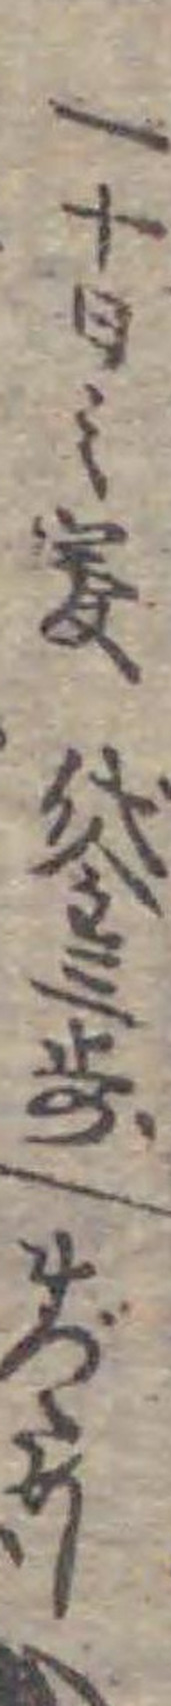一十日之夢代金三歩
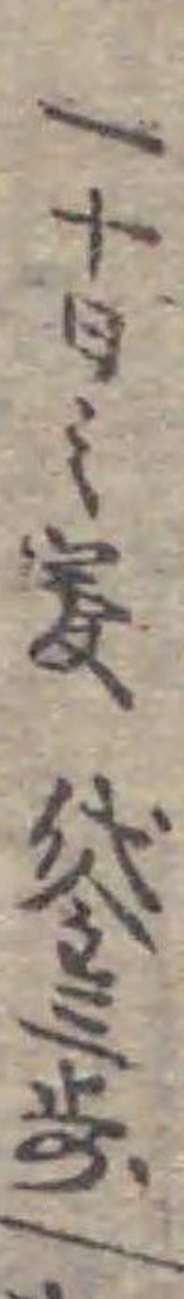一十日之夢代金三歩
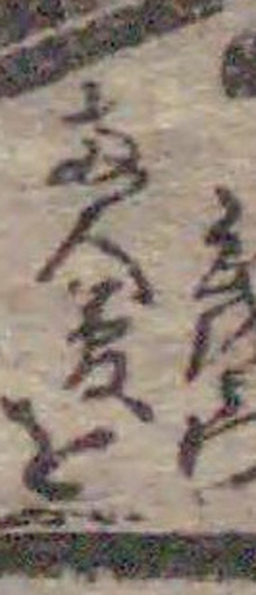両人夢を
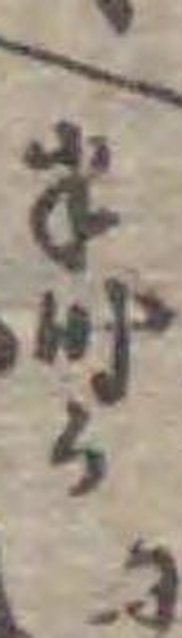半時か
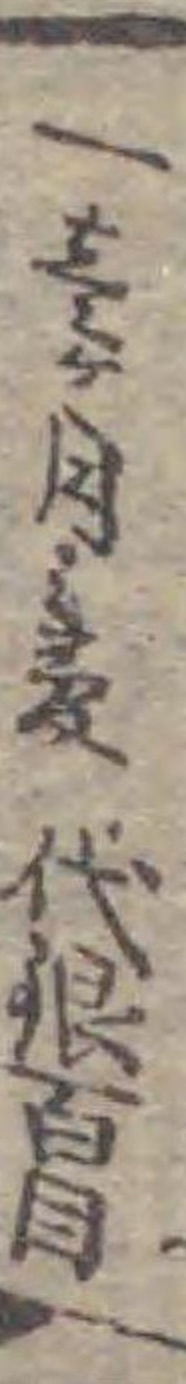一壱ケ月之夢代銀百目
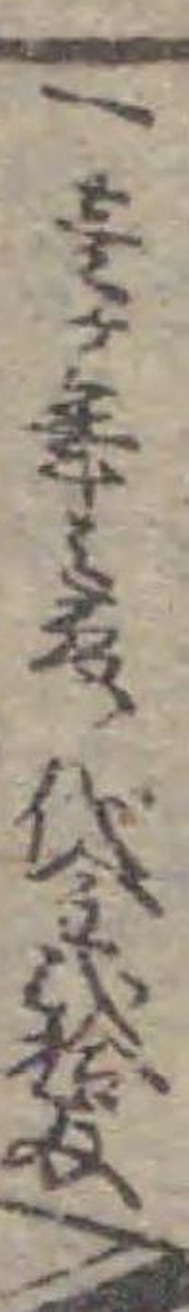一壱ケ年之夢代金弐拾両
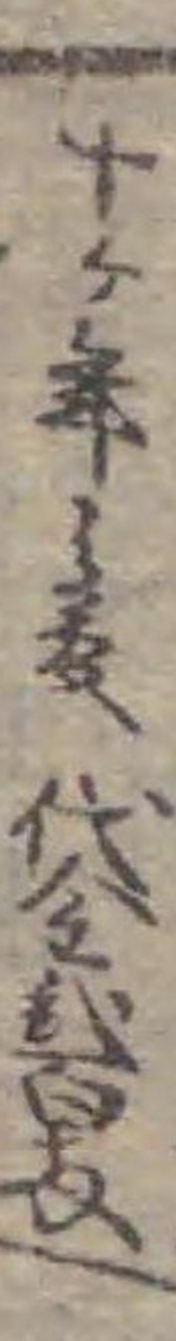十ケ年之夢代金弐百両
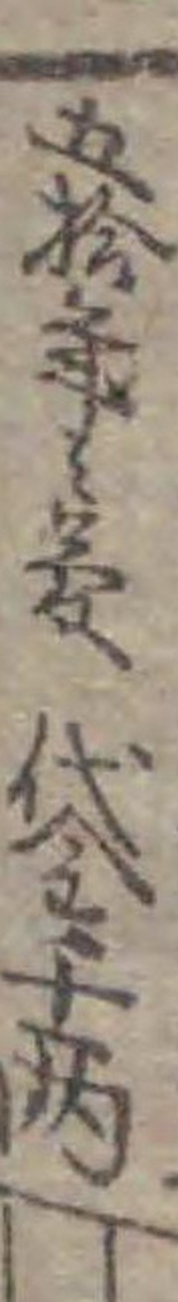五拾年之夢代金千両
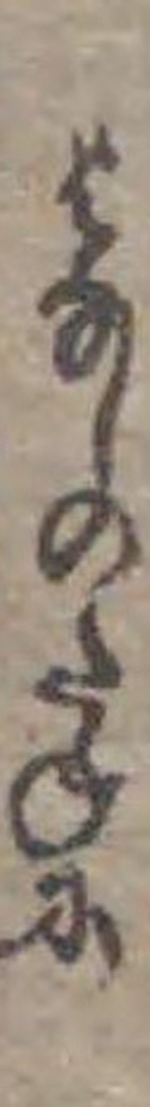はなしのたねに
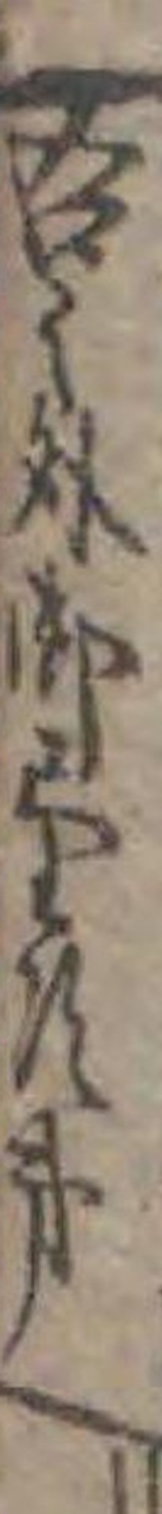右之外御望次第
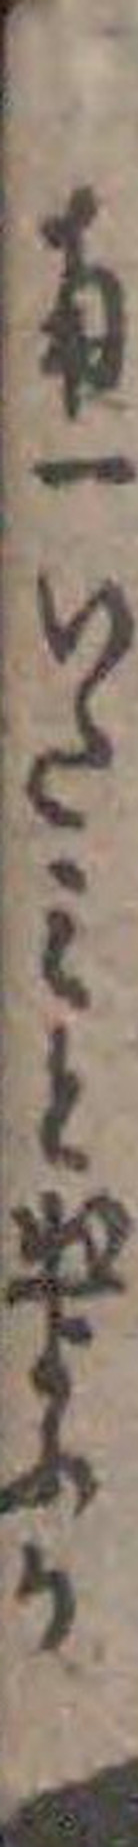南一いたみと出よふか
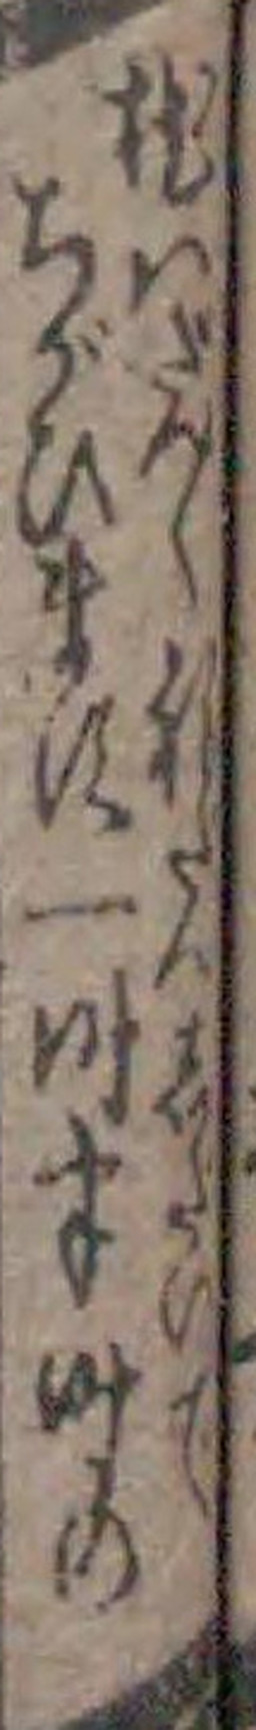ちがひます一時半時の
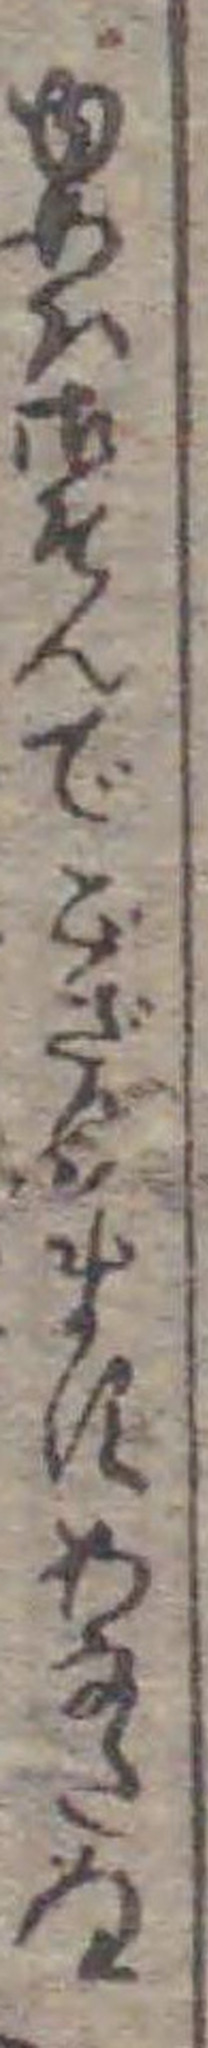ゆめは御そんでござりますあなたさま
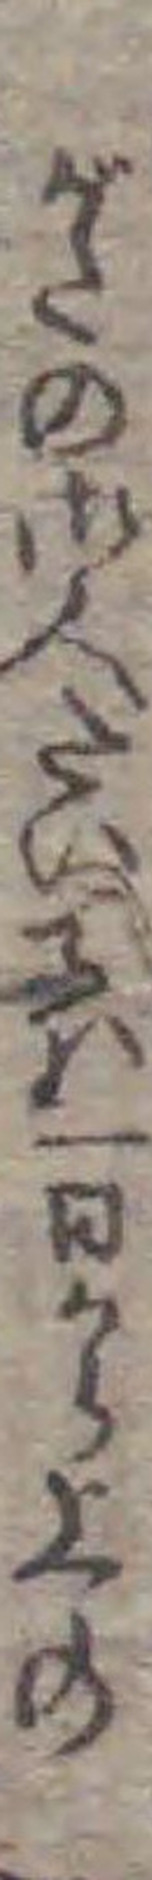がたの御人たいでは一日から上の
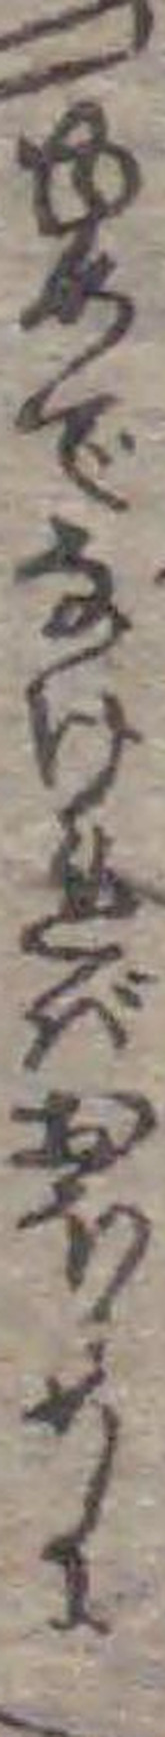ゆめでなければおほしめしに
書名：見徳一炊夢 : 3巻
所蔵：国立国会図書館 National Diet Library, JAPAN
